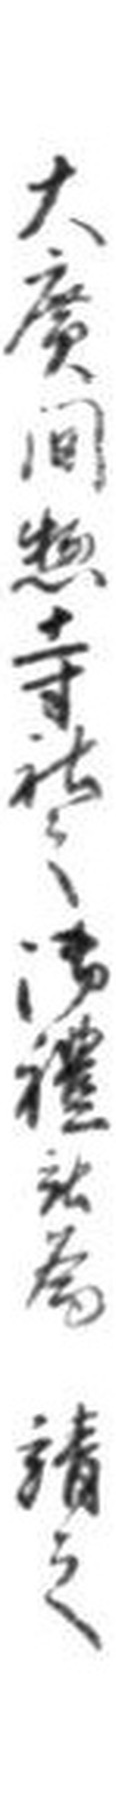大広間惣寺社之御礼被為請之
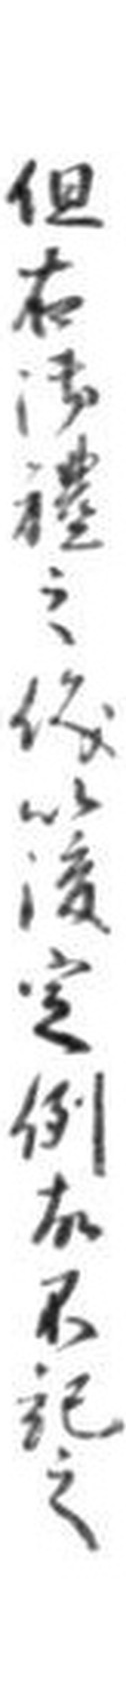但右御礼之儀以後定例故不記之
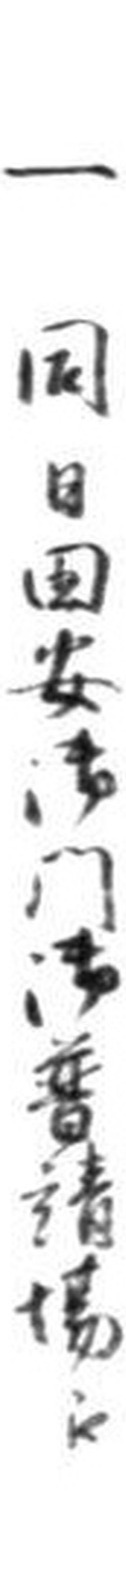一同日田安御門御普請場江
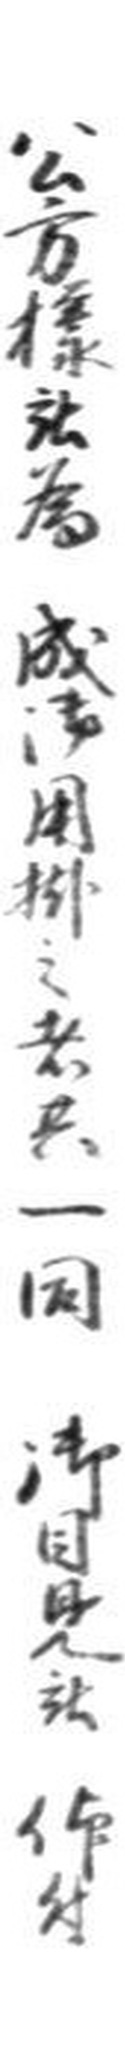公方様被為成御用掛之者共一同御目見被仰付
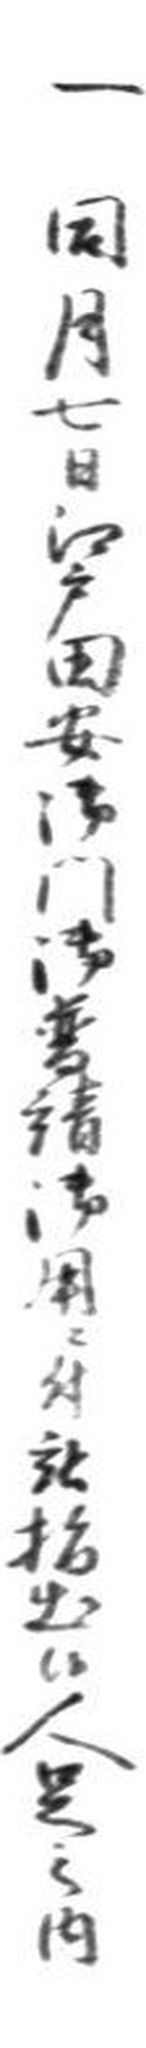一同月七日江戸田安御門御普請御用ニ付被指出候人足之内
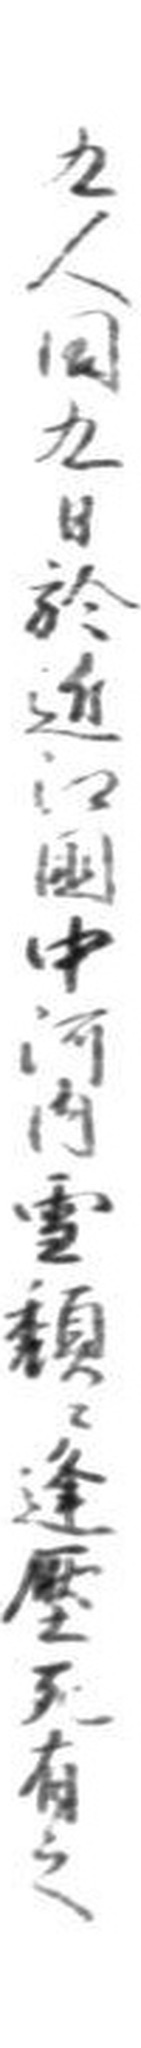九人同九日於近江国中河内雪頽ニ逢圧死有之
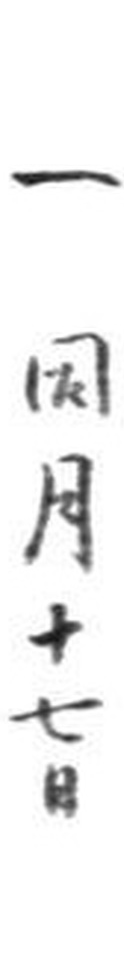一同月十七日
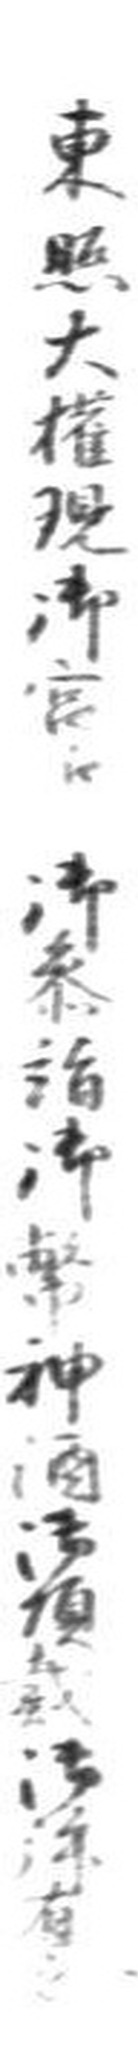東照大権現御宮江御参詣御幣神酒御頂戴御拝有之
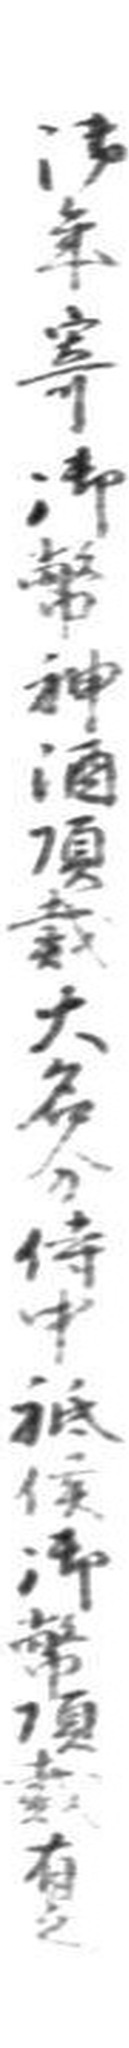御年寄御幣神酒頂戴大名分侍中祗候御幣頂戴有之
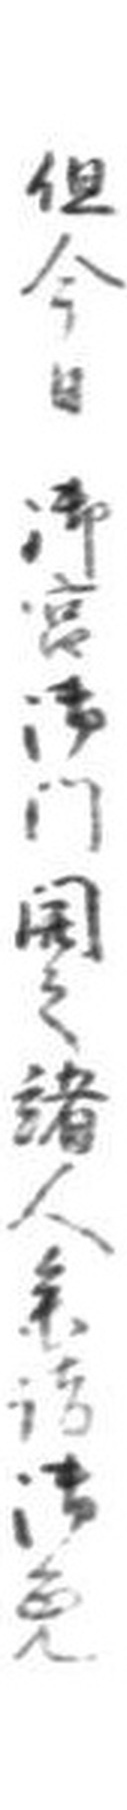但今日御宮御門開之諸人参詣御免
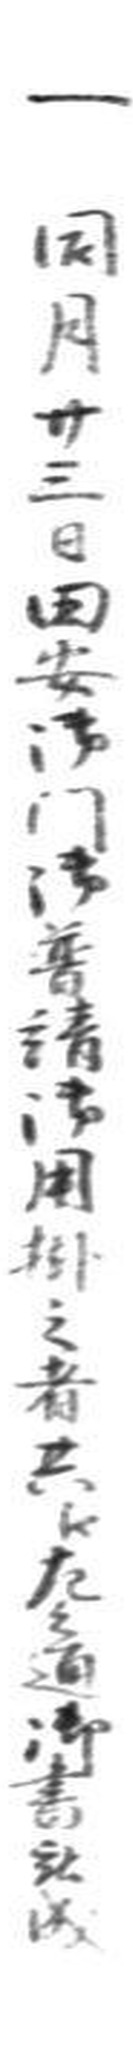一同月廿三日田安御門御普請御用掛之者共江左之通御書被成
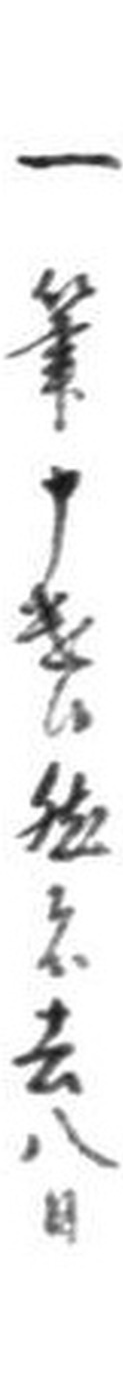一筆申遣候然者去八日
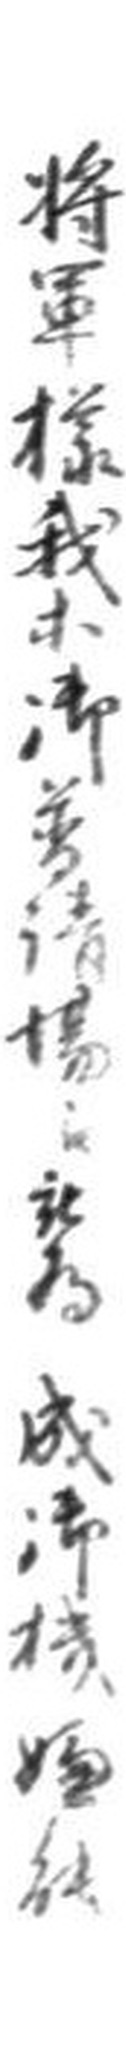将軍様我等御普請場江被為成御機嫌能

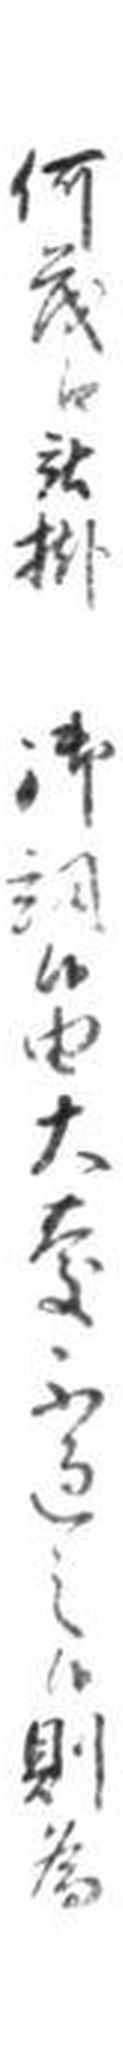何も江被掛御詞候由大慶不過之候則為
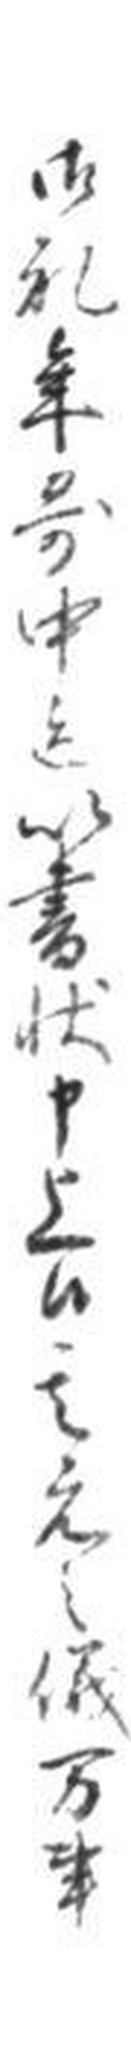御礼年寄中迄以書状申上候其元之儀万事
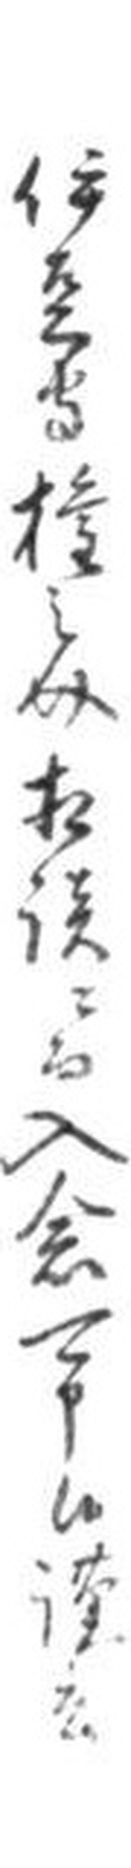伊豆守権之介相談ニ而入念可申候謹言
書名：家譜 三 忠昌公 従慶長八年到寛永六年
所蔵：福井県文書館 Fukui Prefectural Archives
